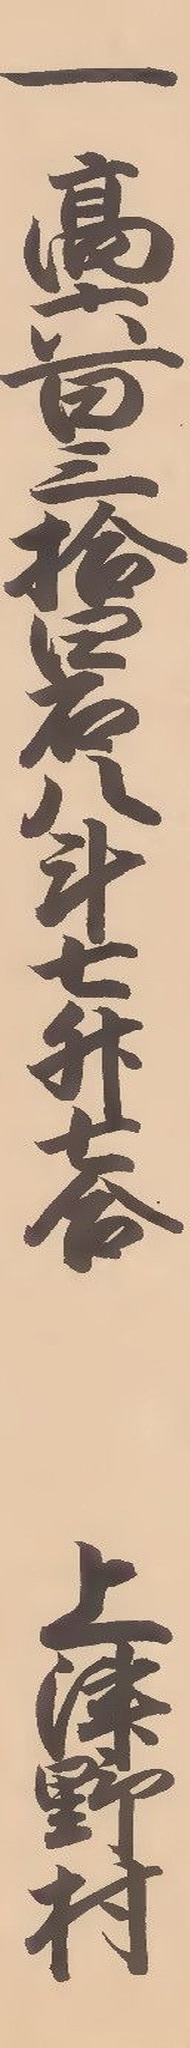一髙六百三拾四石八斗七升七合上津野村
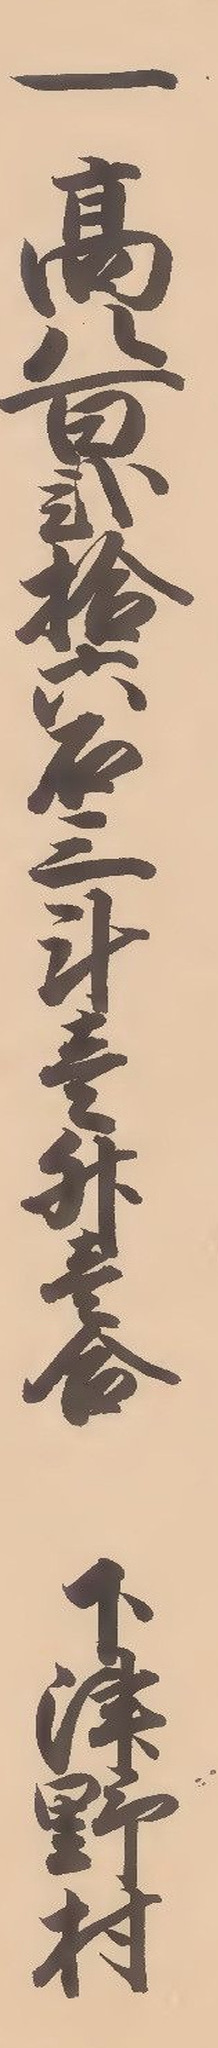一髙八百弐拾六石三斗壱升壱合下津野村
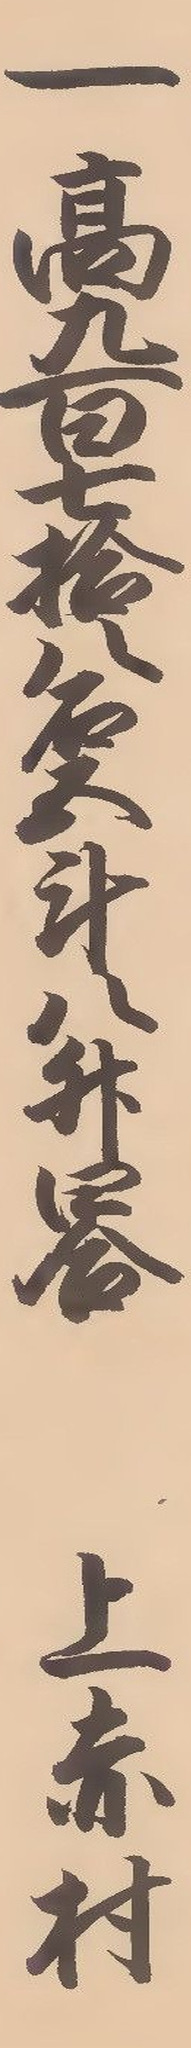一髙九百七拾八石五斗八升四合上赤村
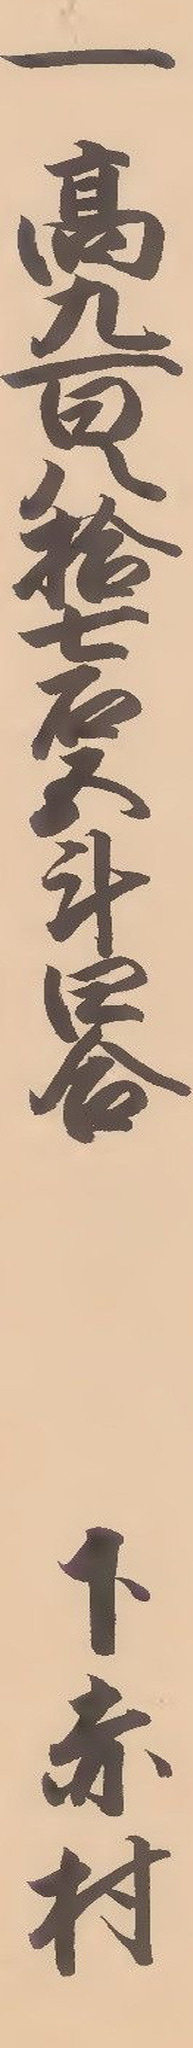一髙九百八拾七石五斗四合下赤村

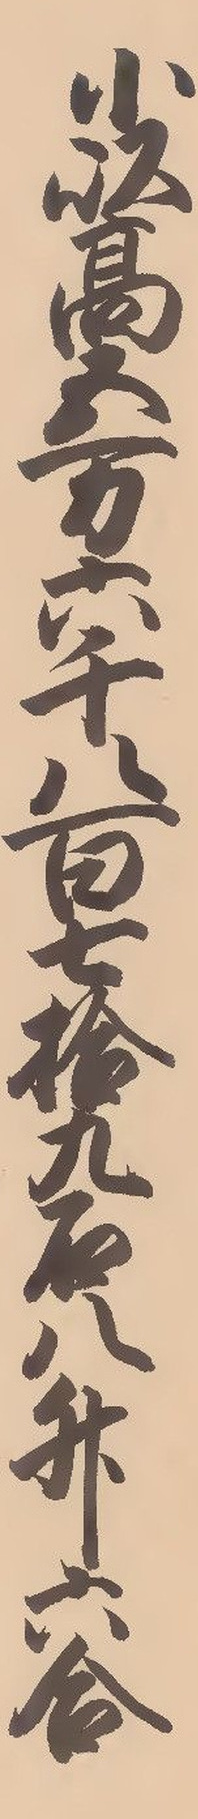小以髙五万六千八百七拾九石八升六合
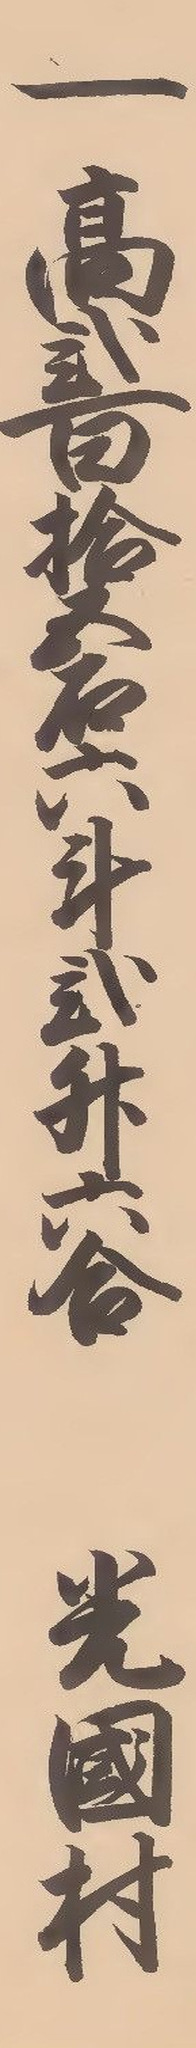一髙弐百拾五石六斗弐升六合光國村
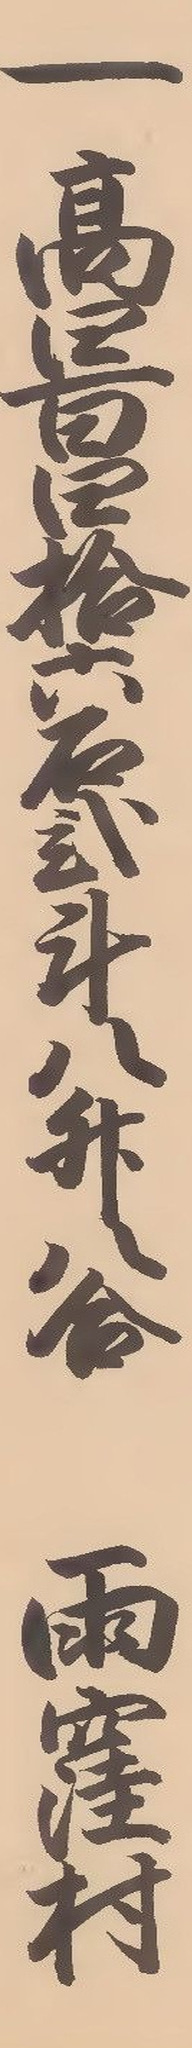一髙四百四拾六石弐斗八升八合雨窪村
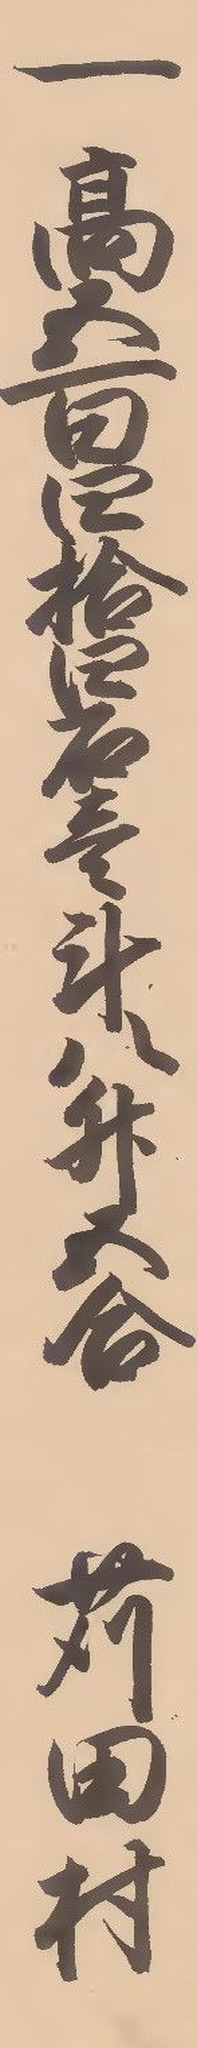一髙五百四拾四石壱斗八升五合苅田村

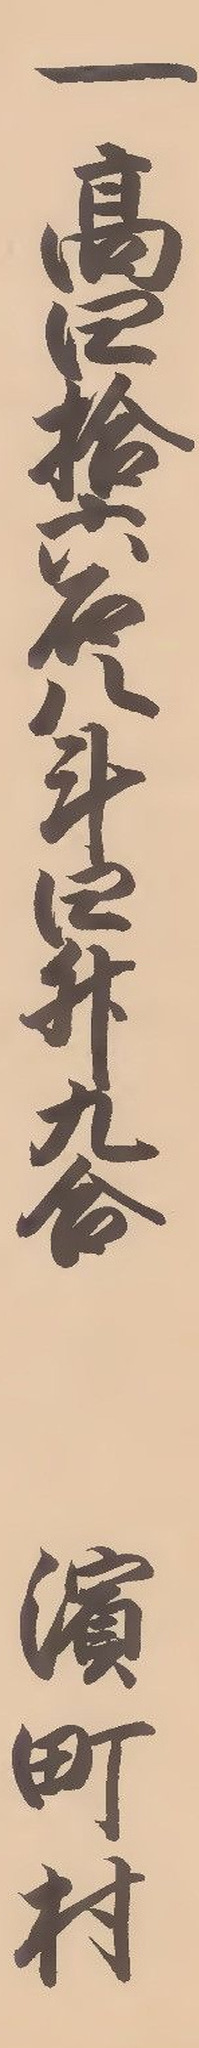一髙四拾六石八斗四升九合濱町村
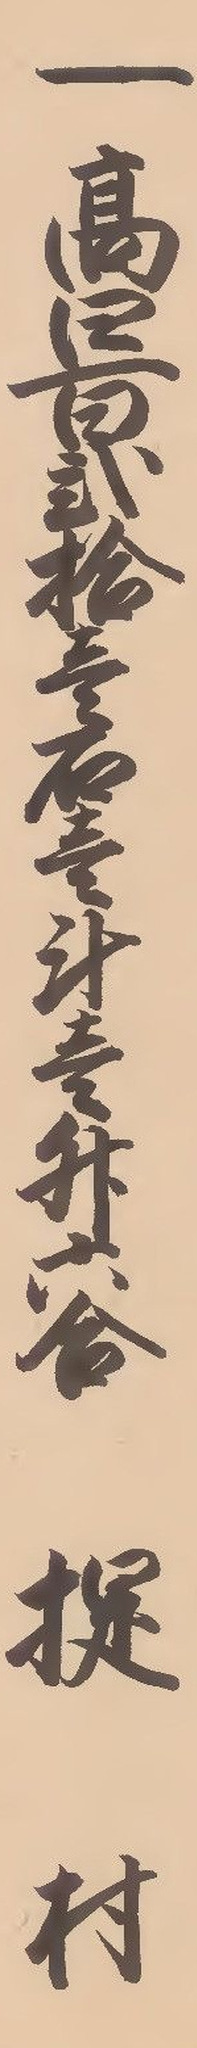一髙四百弐拾壱石壱斗壱升六合提村
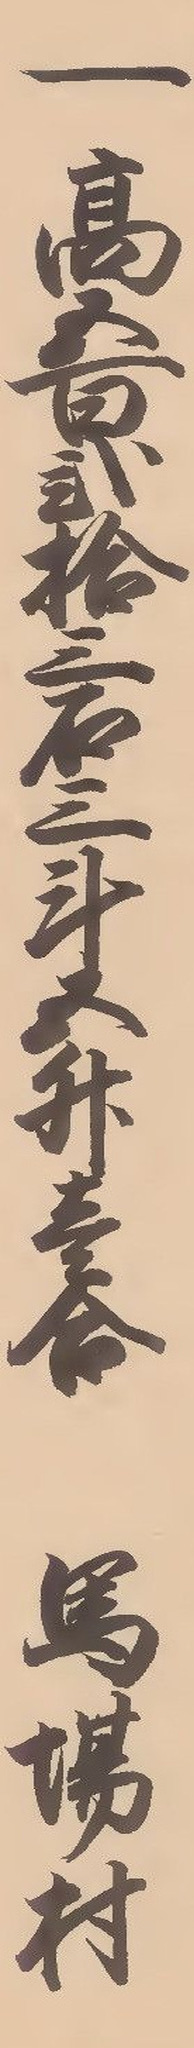一髙五百弐拾三石三斗五升壱合馬場村
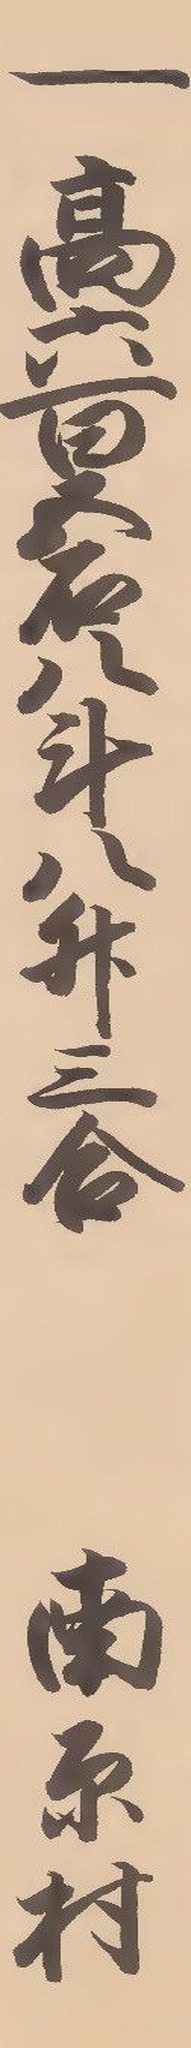一髙六百五石八斗八升三合南原村
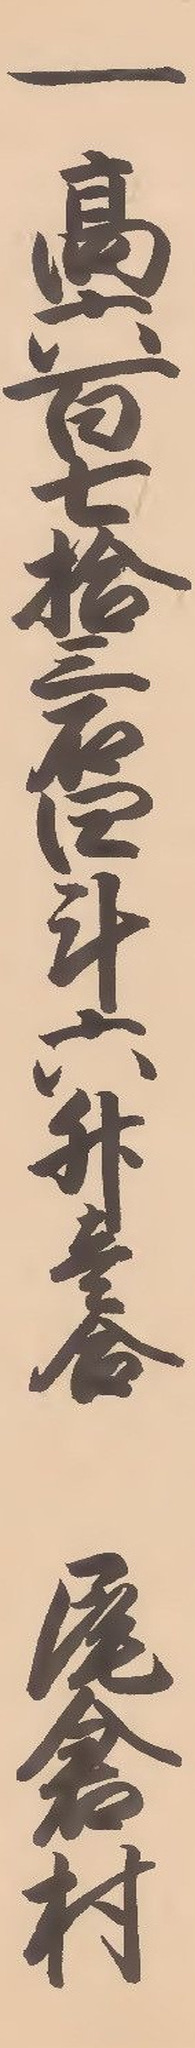一髙六百七拾三石四斗六升壱合尾倉村
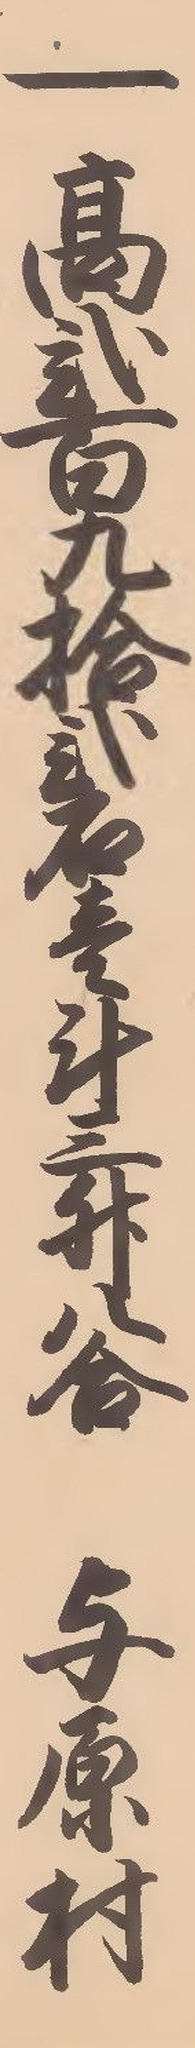一髙弐百九拾弐石壱斗三升八合与原村
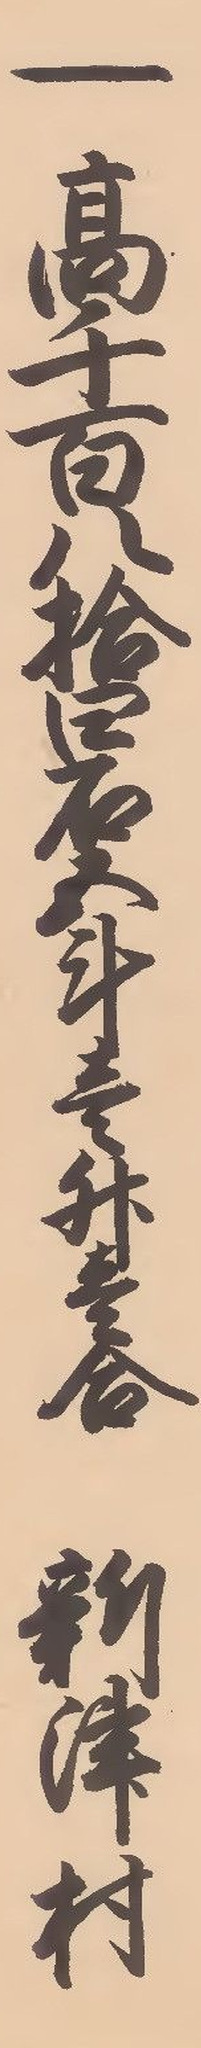一髙千百八拾四石五斗壱升壱合新津村

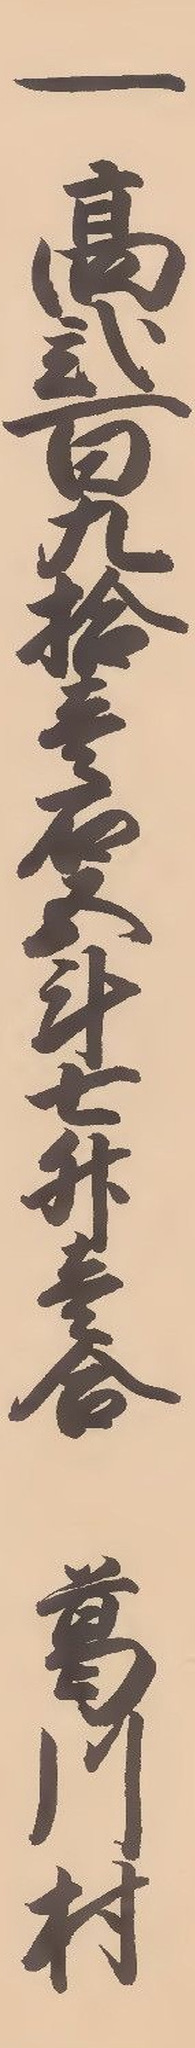一髙弐百九拾壱石五斗七升壱合葛川村
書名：豊前国郷帳
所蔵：国立公文書館 National Archives of Japan
